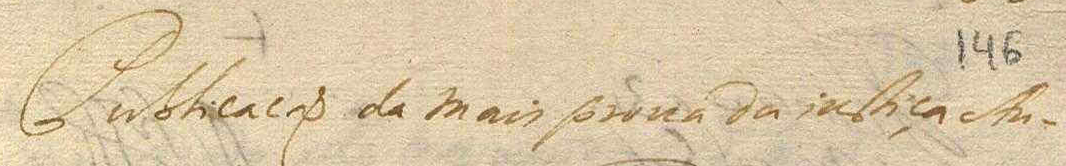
Publicaçaõ da mais proua da iustiça Au
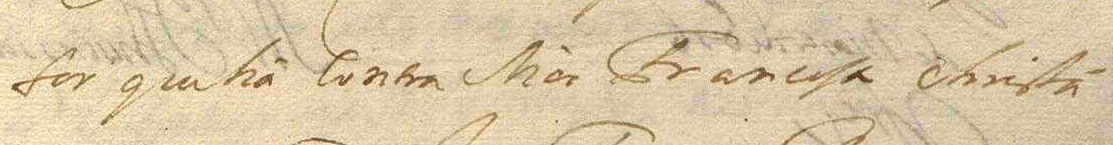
tor que há contra Mór Francesa christã
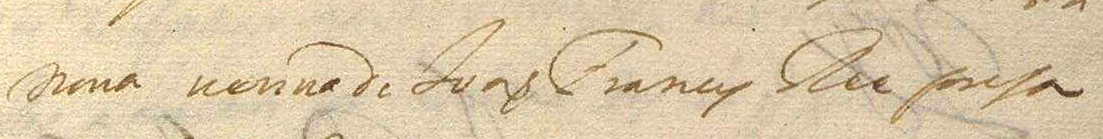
noua ueuua de Ioaõ Frances Ree presa
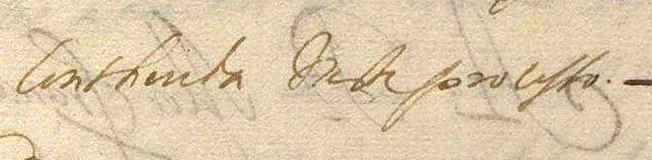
Contheuda neste processo.
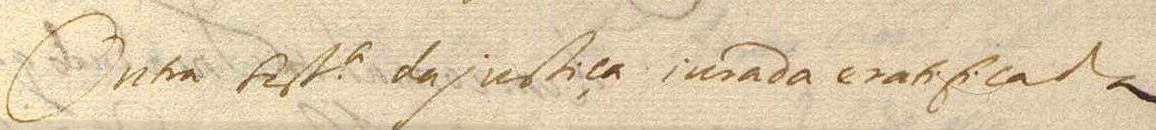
Outra test.a da justiça iurada e ratificada
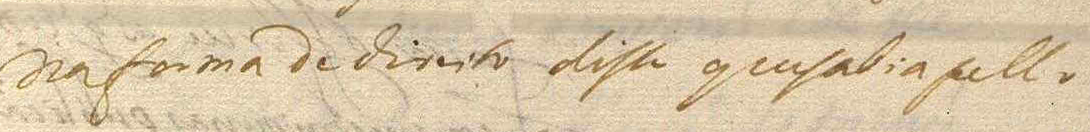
na forma de direito disse que sabia pello
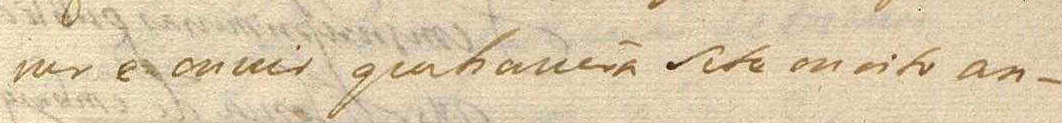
uer e ouuir que hauerá sete ou oito an
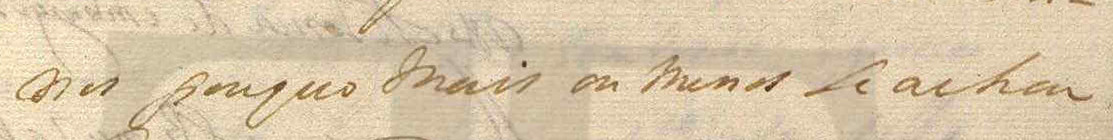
nos pouquo mais ou menos se achou
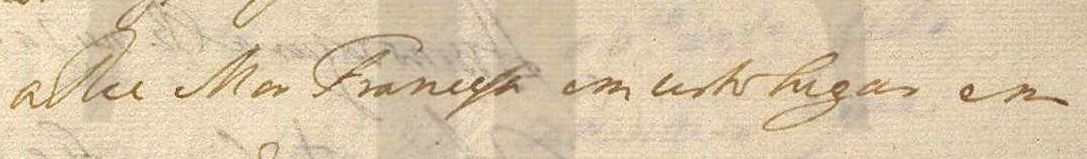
a Ree Mor Francesa em certo lugar em
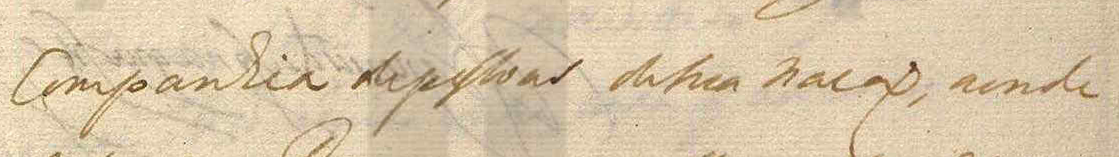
Companhia de pessoas de sua naçaõ, aonde
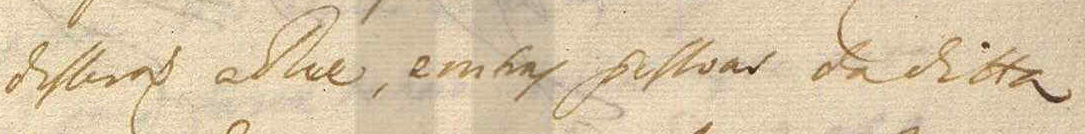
disseraõ a Ree, e outras pessoas da ditta
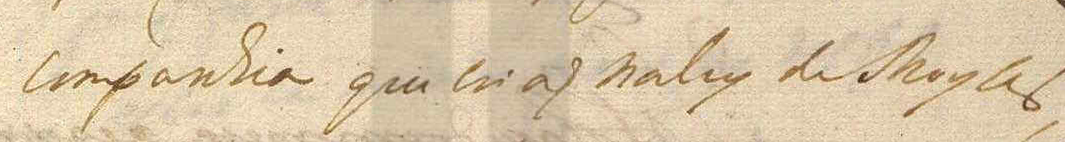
companhia que criaõ na ley de Moyses
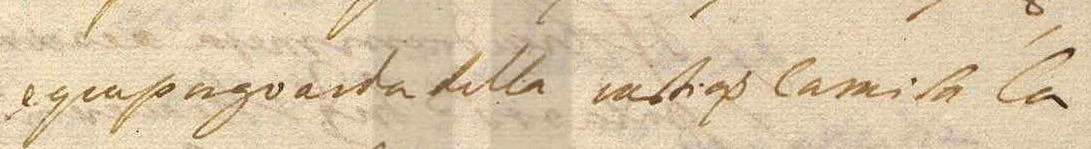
e que por goarda della uestiaõ Camisa la
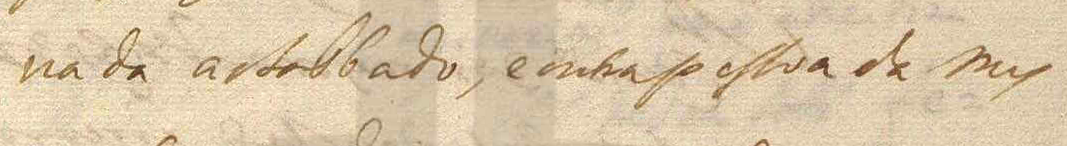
uada ao sabbado, e outra pessoa da mes
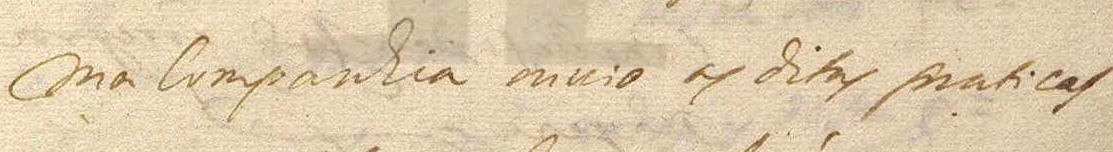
ma Companhia ouuio as ditas praticas
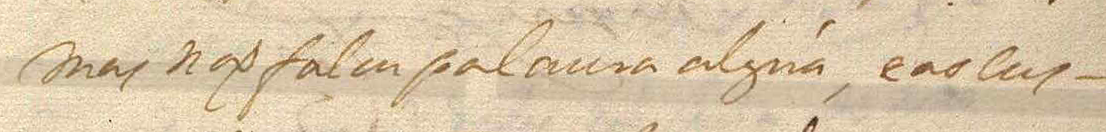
mas naõ falou palaura alguā, e as cus
